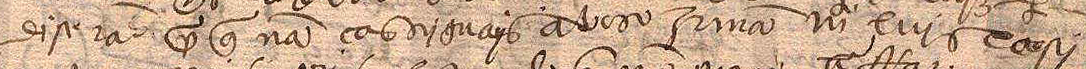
diserão p̄oq̄ não castyguays a voso Jrmão mte lujs e asy
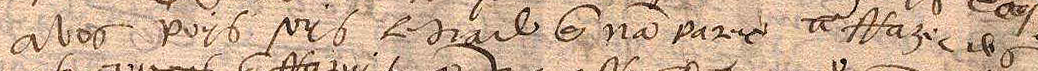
a vos poys soys letrado q̄ nā parece bē ffazerdes
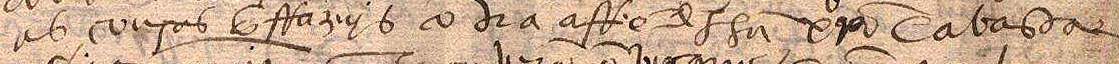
as cousas q̄ ffazeys cōtra a ffee de Jhū xopō e abastar
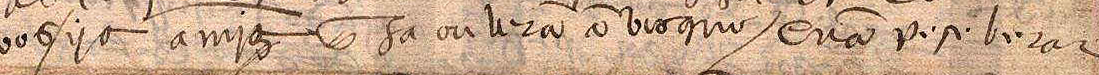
vos / ya a m̄ja q̄ Ja ouverão cōvosquo / e nā peseverar
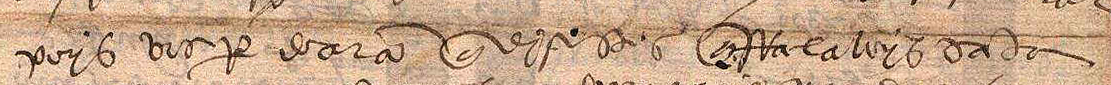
poys vos ꝑdoarão q̄ dysestes q̄ ffalaveys sāta
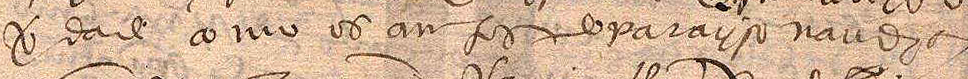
ꝟdade como os anJos do parayso naudja
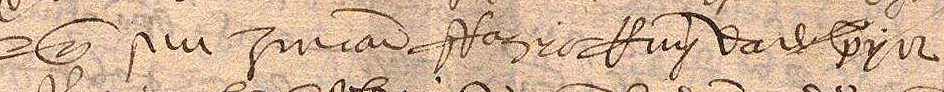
e q̄ seu Jrmão ffazya Ruȳdade pyor
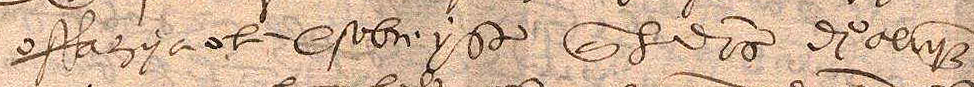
o ffazya ele e sobre ysto q̄ ho dito djo alur̄z
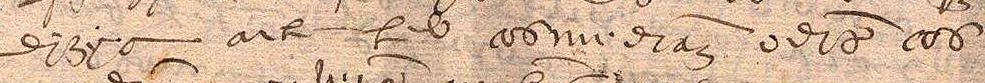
dyzya a ele Ldo cosme diaz o dito cos
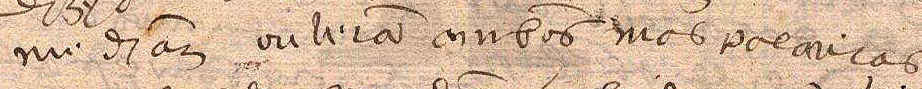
me diaz ouverão ambos mas palauras
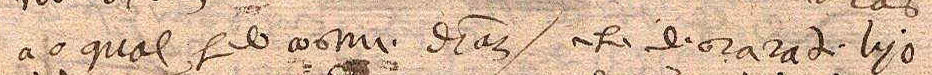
ao qual Ldo cosme diaz / ele decrarāte vyo
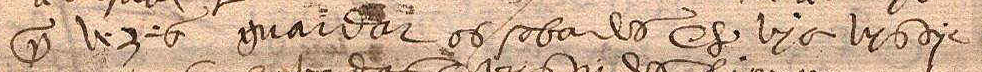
p̄o vezes guardar os sabados e ho vya vystyr
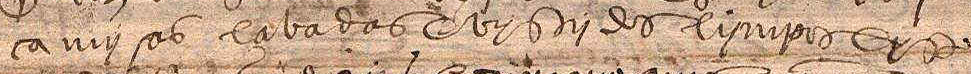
camysas lavadas e vystydos lympos e ysto
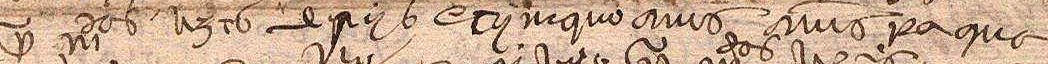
p̄o mtas vezes de seys e cymquo anos anos pa qua
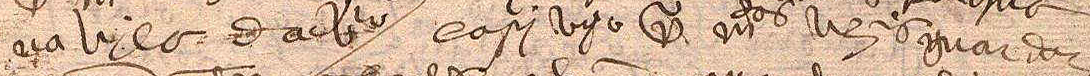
na vyla davro / e asy vyo p̄o mtas vezes guardar
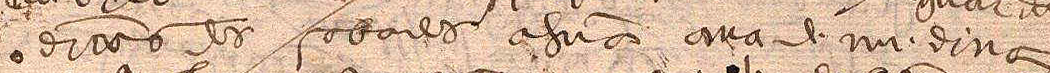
o dias dos sabados a huā ana de medina
